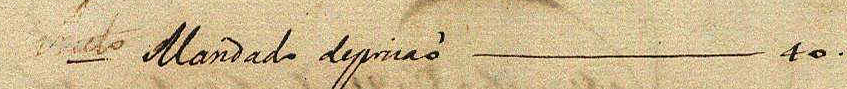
Auto Mandado de prizaõ 40.
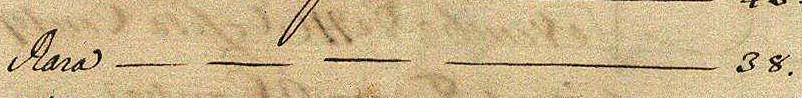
Raza 38.
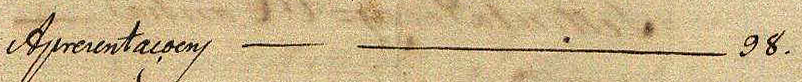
Aprezentaçoens 98.
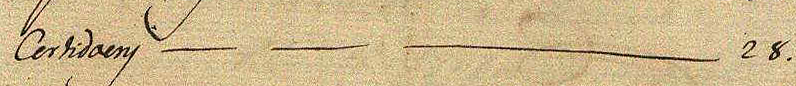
Certidoens 28.
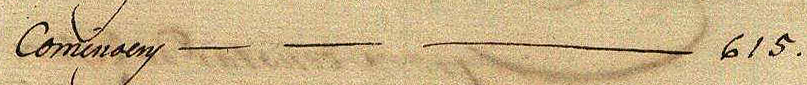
Comissoens 615.
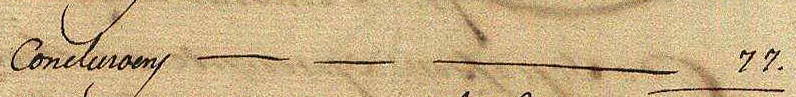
Concluzoens 77.
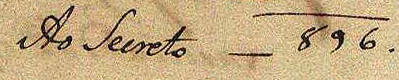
Ao Secreto 896.
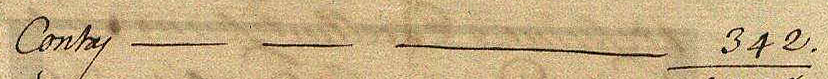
Contas 342.
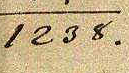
1238.
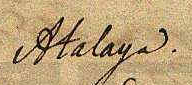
Atalaya.
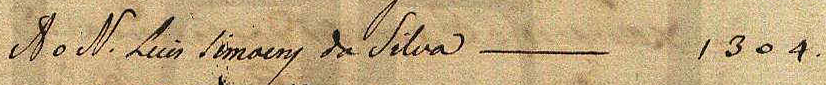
Ao N. Luis Simoens da Silva 1304.
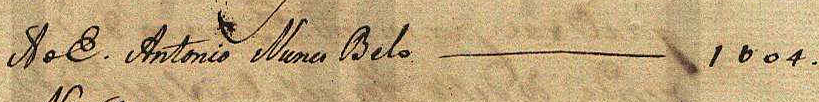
Ao E. Antonio Nunes Belo 1004.
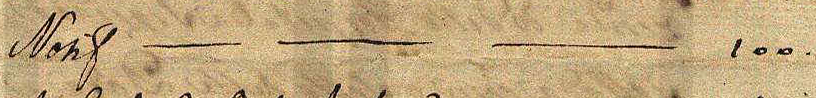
Notif 100.
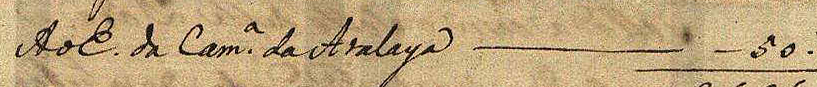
Ao E. da Cam.a da Atalaya 50.
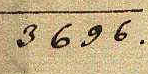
3696
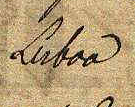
Lisboa
